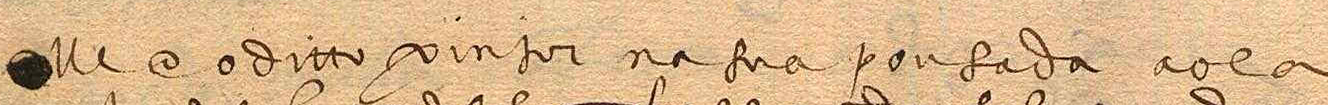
elle e o ditto pintor na sua pousada ao ca
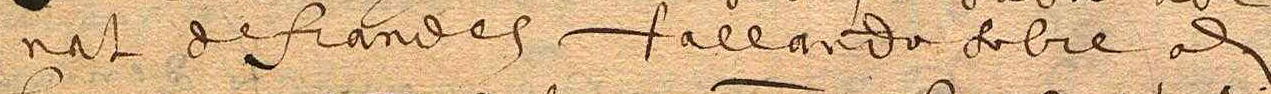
nal de frandes fallando sobre os
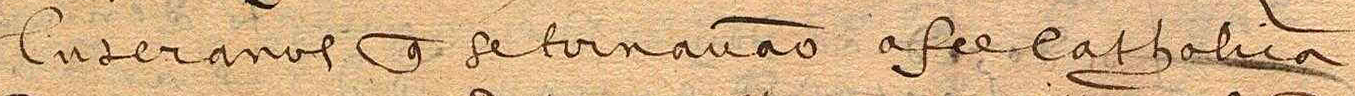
luteranos q̄ se tornauão a fee catholica
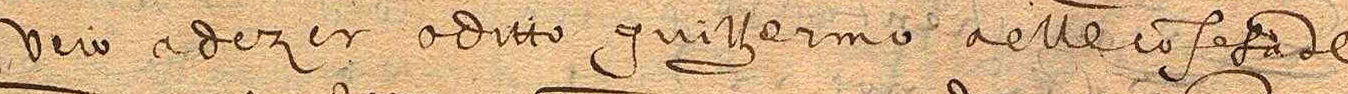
veio a dezer o ditto guilhermo a elle cōfesāte
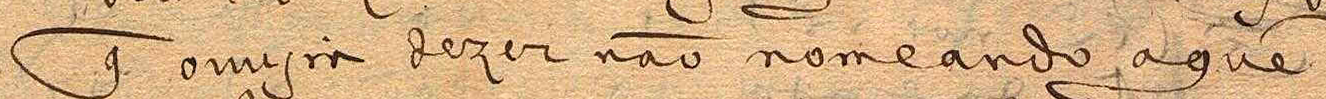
q̄ ouujra dezer não nomeando a quē
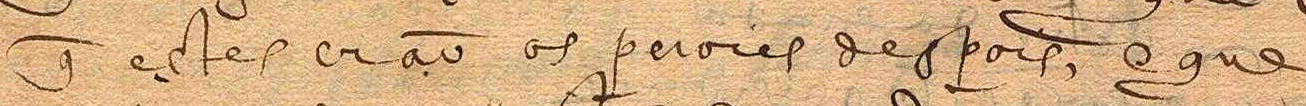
q̄ estes erão os peiores despois, e que
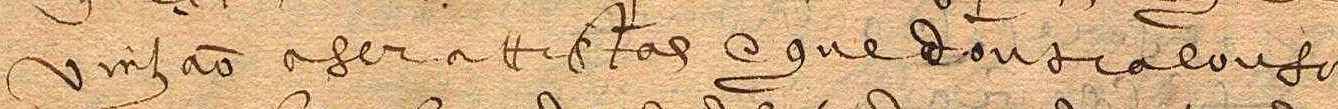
vinhão a ser attestas e que doutra cousa
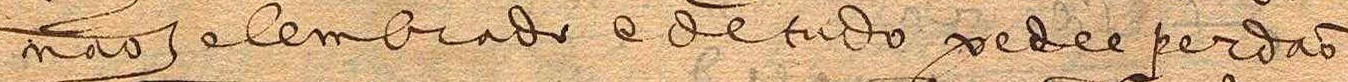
não he lembrado e de tudo pedee perdaõ
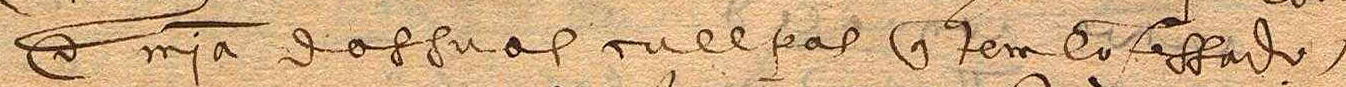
e mj̄a das suas cullpas q̄ tem cōfessado /
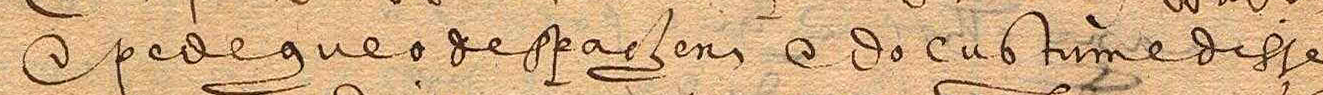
e pede que o despachem e do custume disse
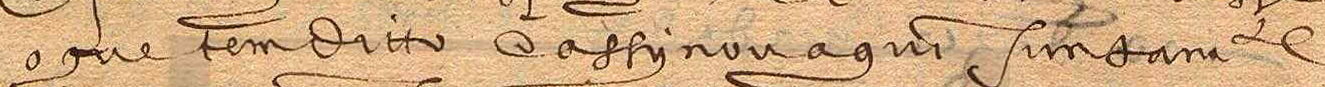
o que tem ditto e assynou aqui Juntamte
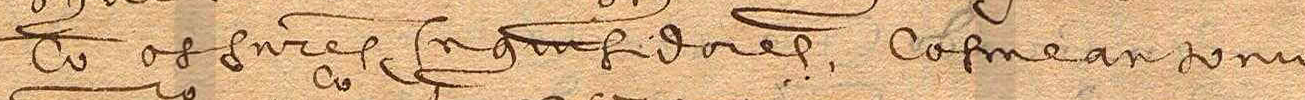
c̄o os snr̄es Jnquisidores, cosme antonio
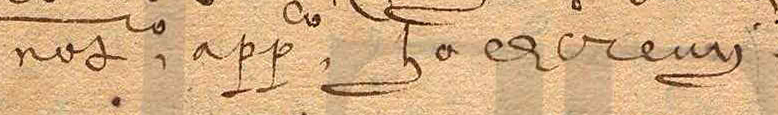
notro appco o escreuy
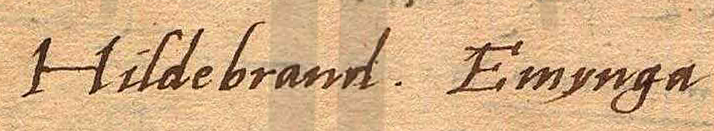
Hildebrand. Emynga
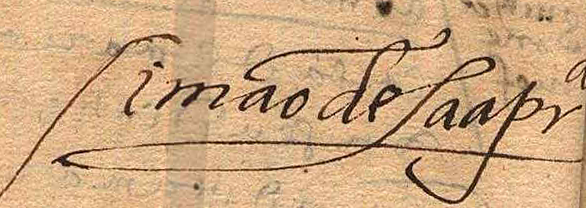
Simão de Saa pra
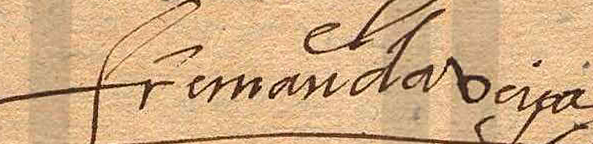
fr̄ emanel da veiga
